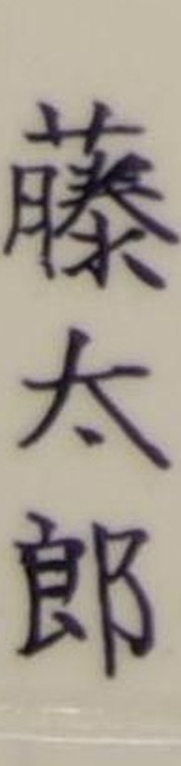藤太郎
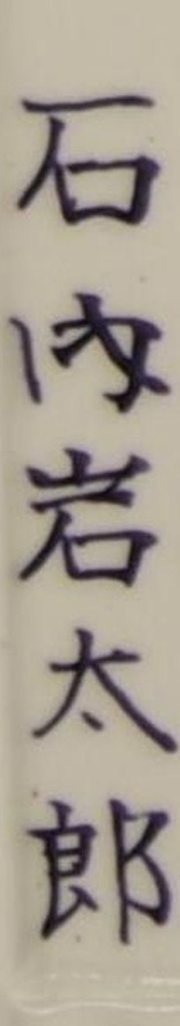石内岩太郎

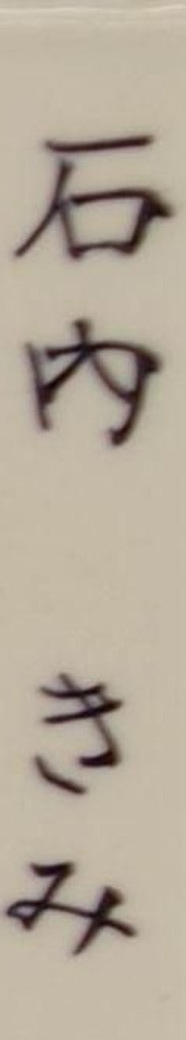石内きみ
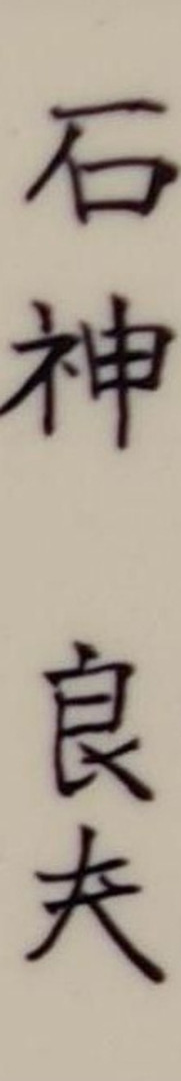石神良夫
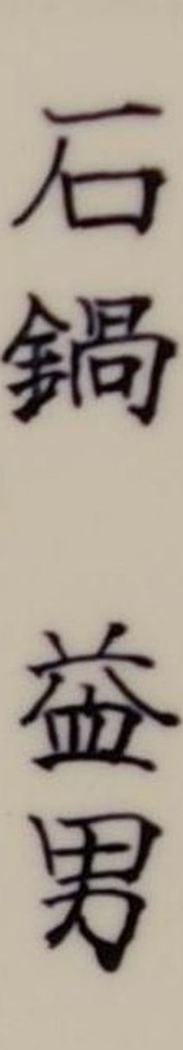石鍋益男
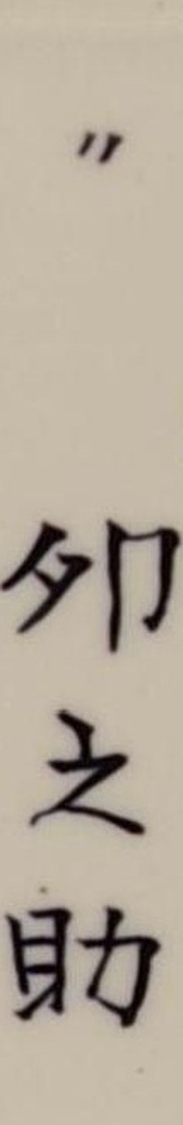卯之助
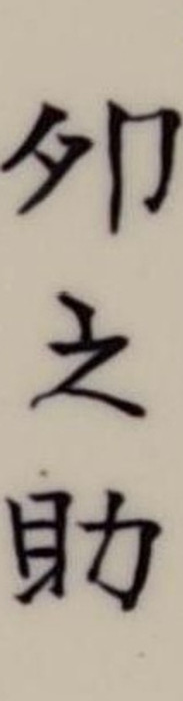卯之助
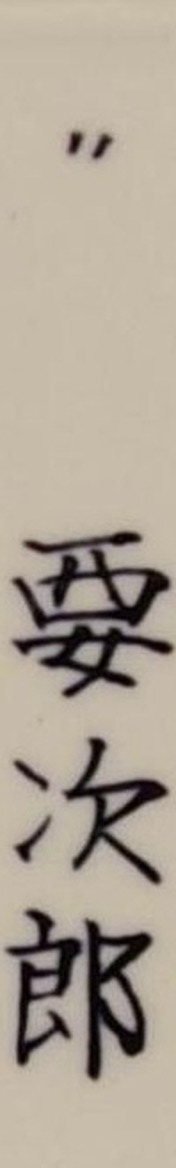要次郎
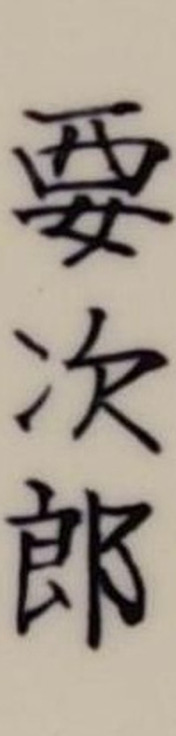要次郎
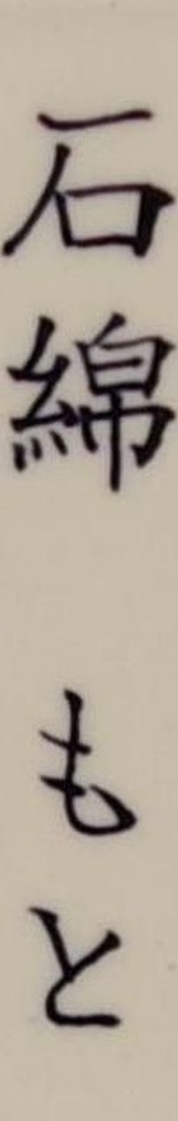石綿もと
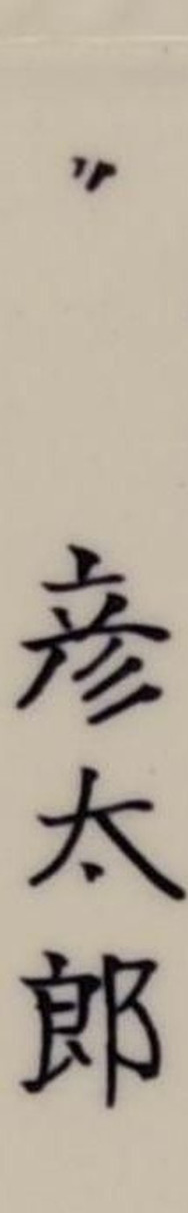彦太郎
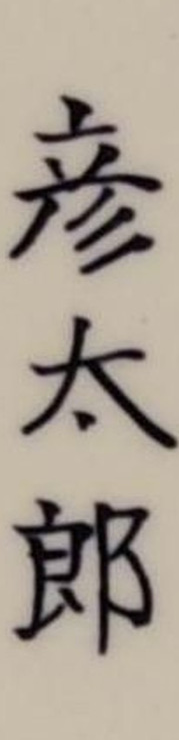彦太郎
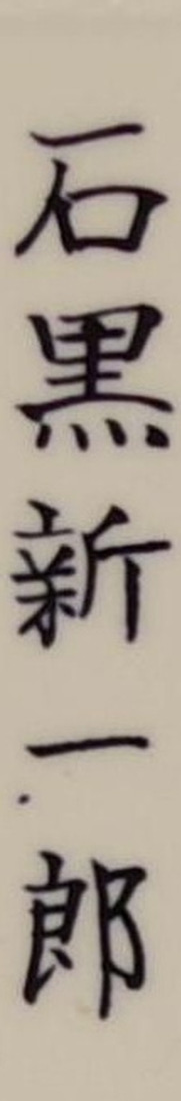石黒新一郎
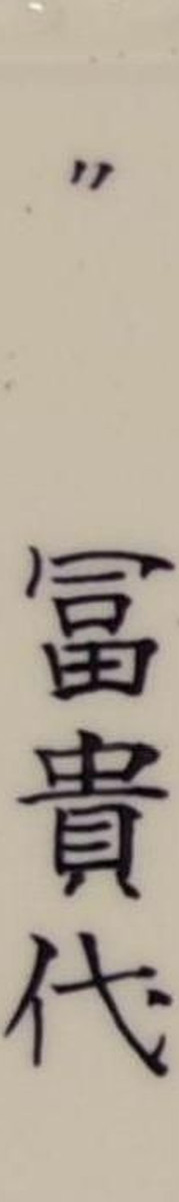冨貴代
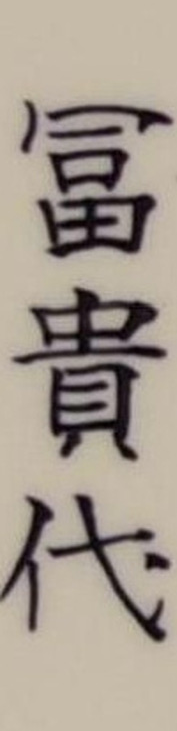冨貴代
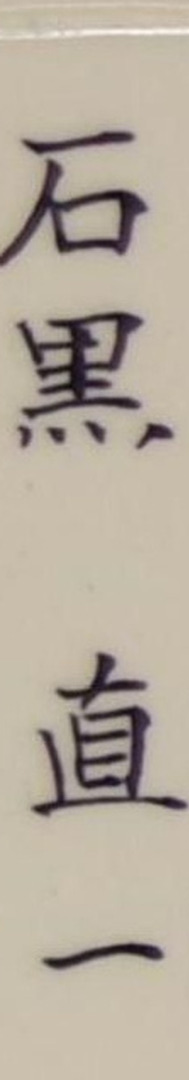石黒直一
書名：M~S
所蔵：高野山金剛峯寺
